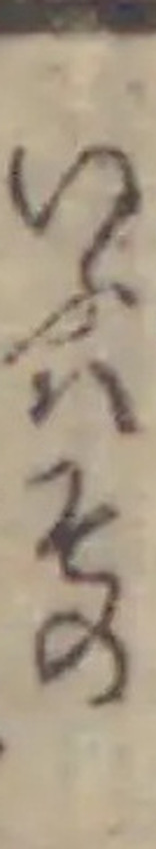いふはその
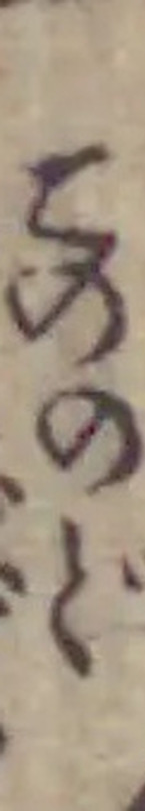こののど
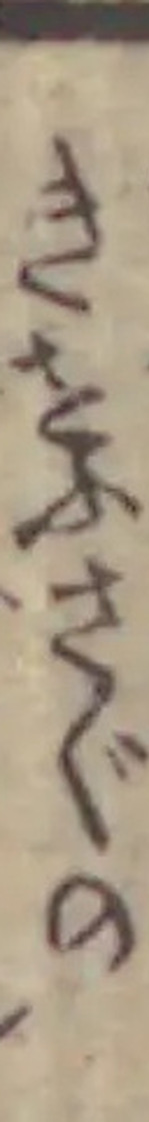きをふさぐの
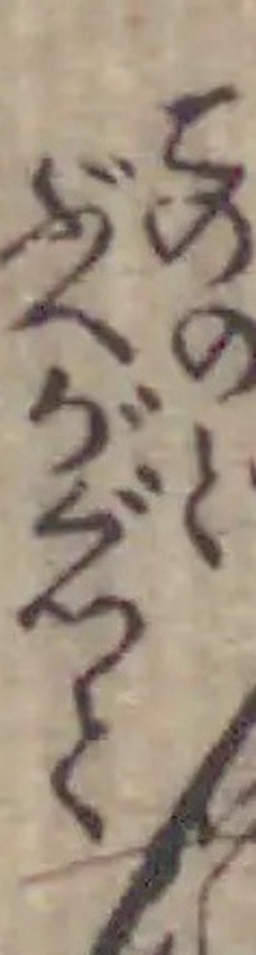ぶへがぐつと
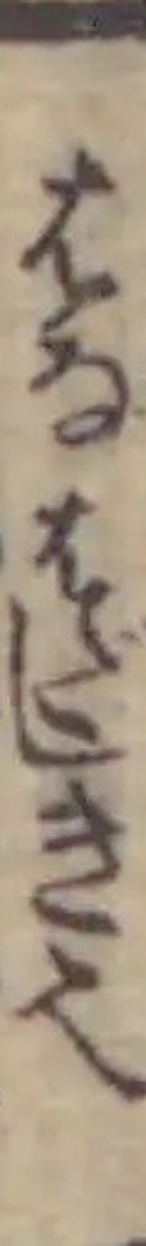はなはだしき也
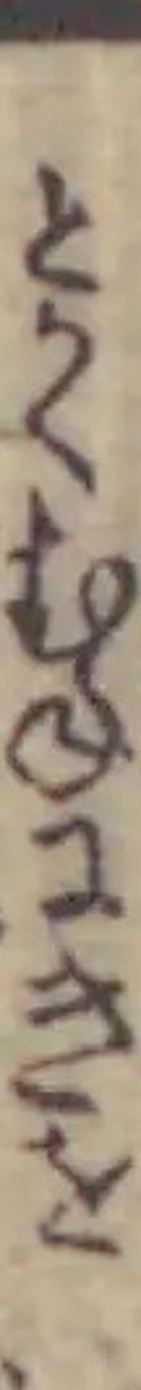とかくむねにきを
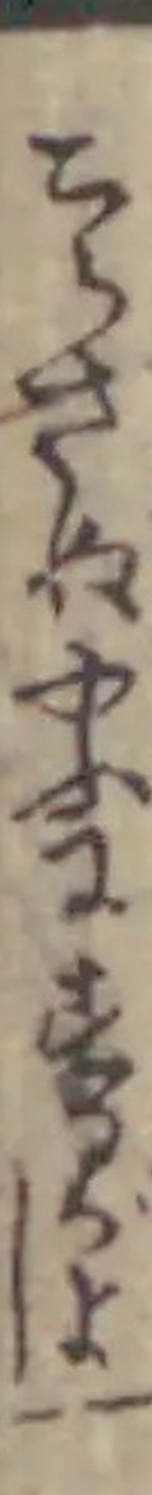こらさぬやふにするがよ
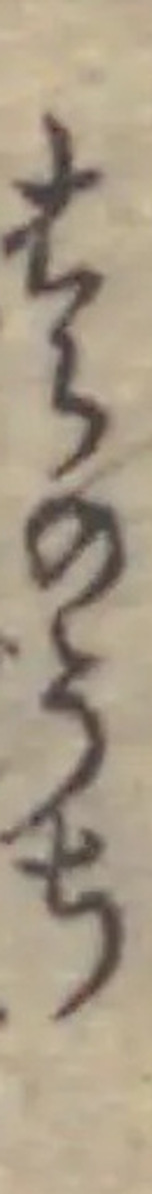はらのうち
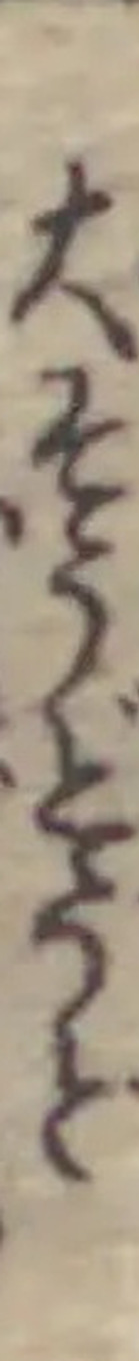大そうどうと
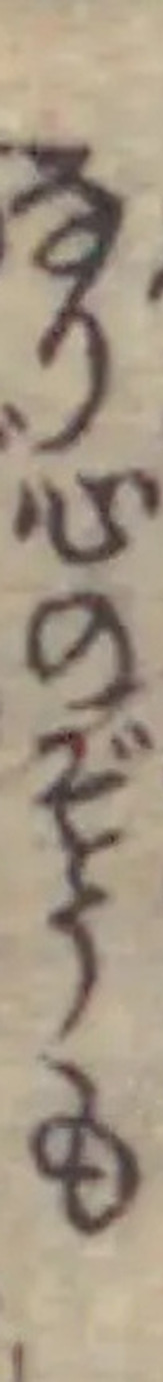なり心のぞうも
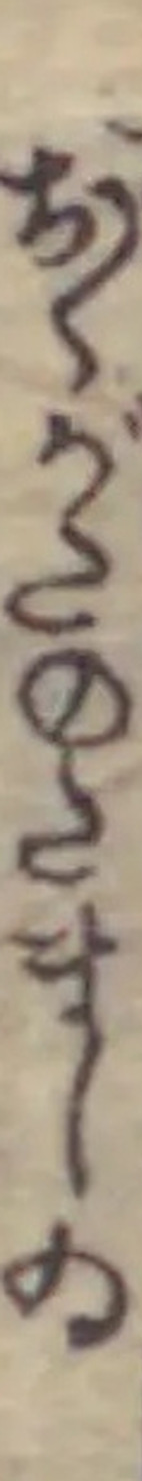おくがたのたましゐ
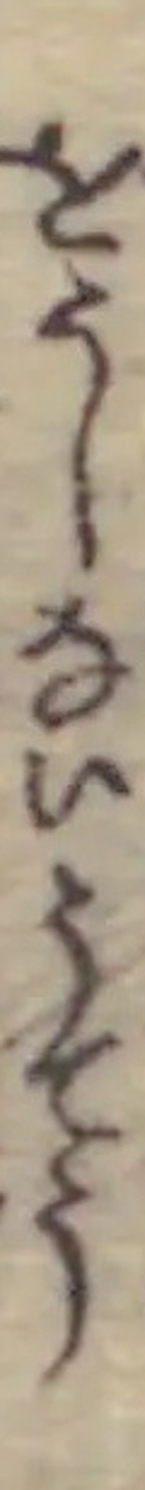をうしないうてう
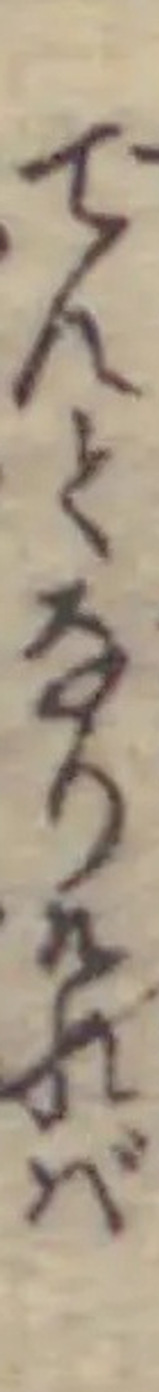てんとなりければ
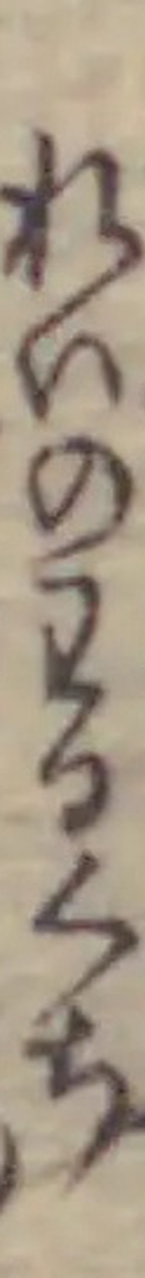れいのわるくち
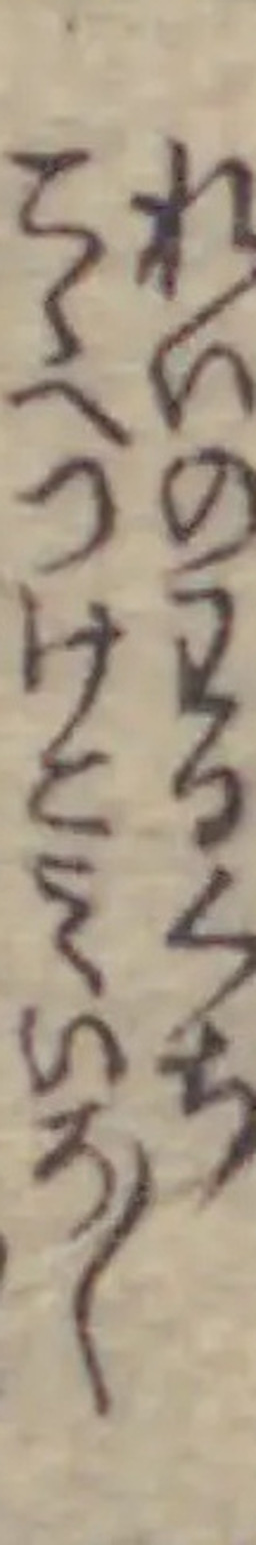こゝへつけこみいろ〳〵
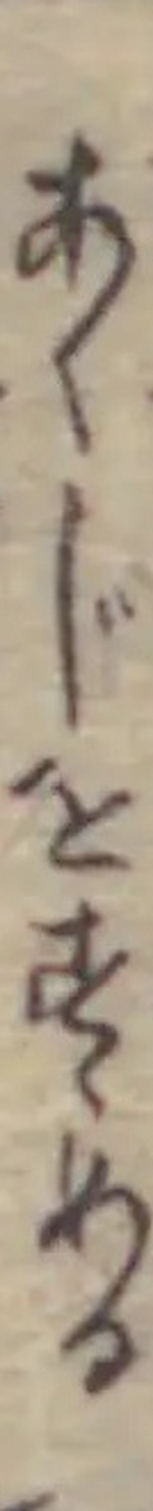あくじをすゝめる
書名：腹内養生主論 3巻
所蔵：国立国会図書館 National Diet Library, JAPAN
